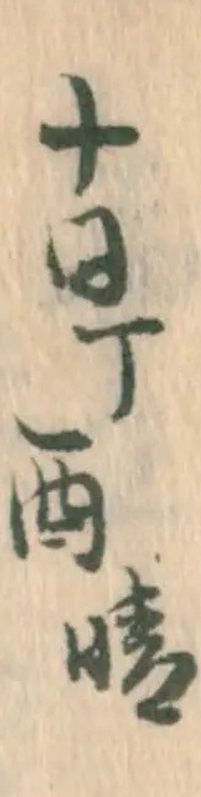十日丁酉晴
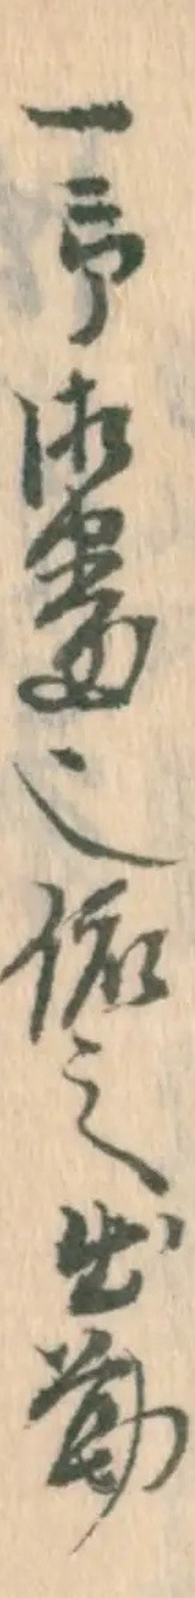一予御番也依之出勤
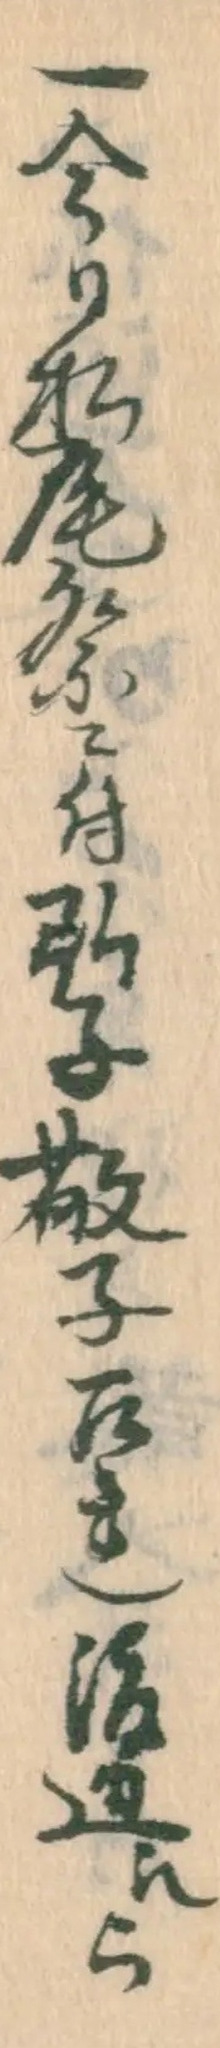一今日松尾祭ニ付弘子敬子召連渡辺え被
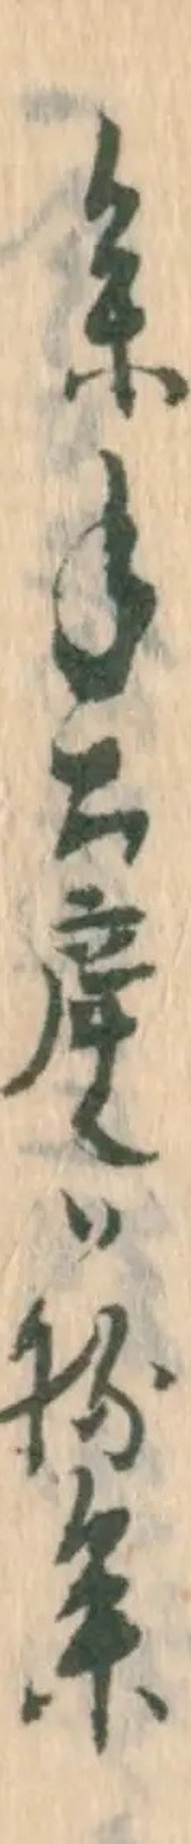参手土産御持参
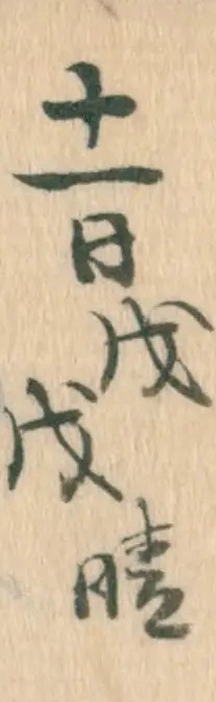十一日戊戌晴
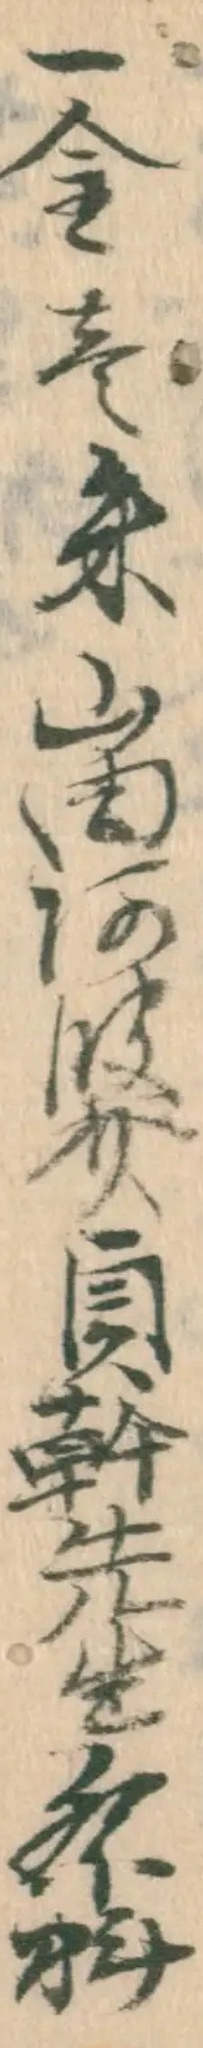一金壱朱山田阿波介貞幹先生祭料
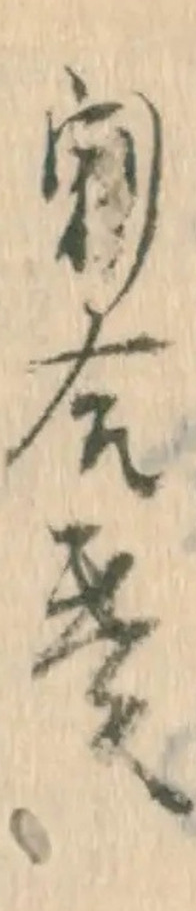割合遣ス
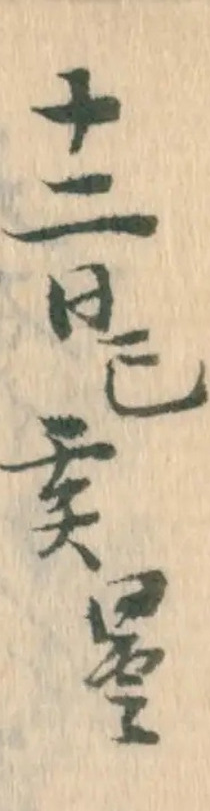十二日己亥曇
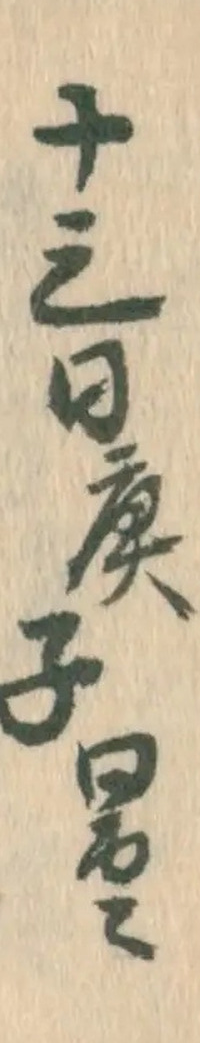十三日庚子曇
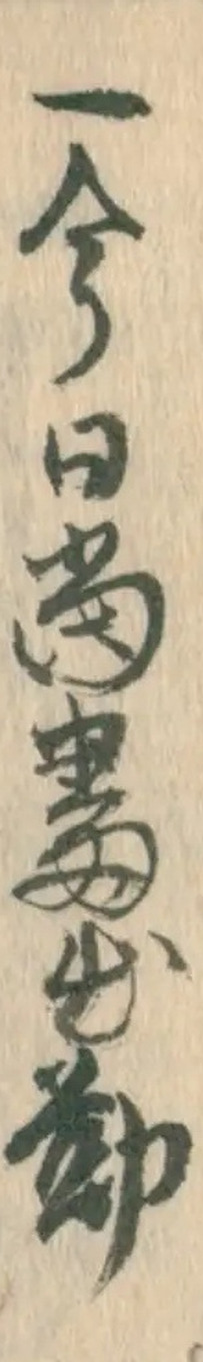一今日当番出勤

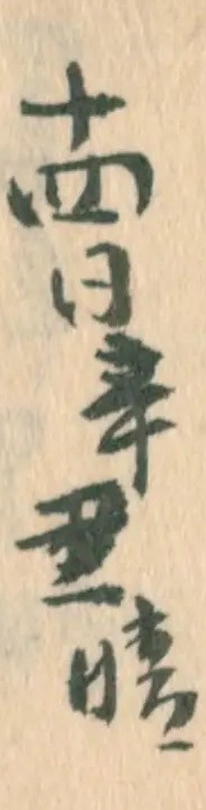十四日辛丑晴
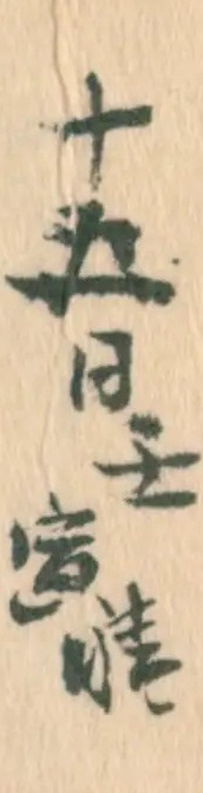十五日壬寅晴
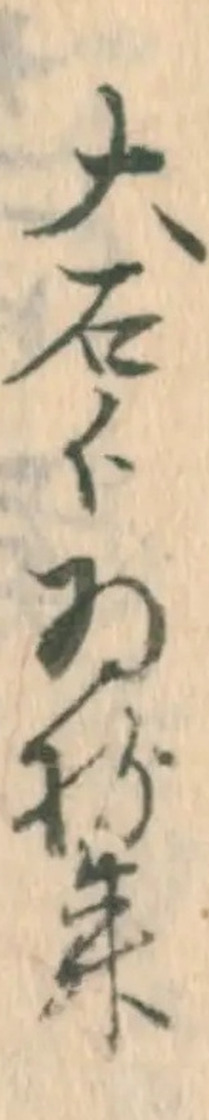大石ゟ為持参
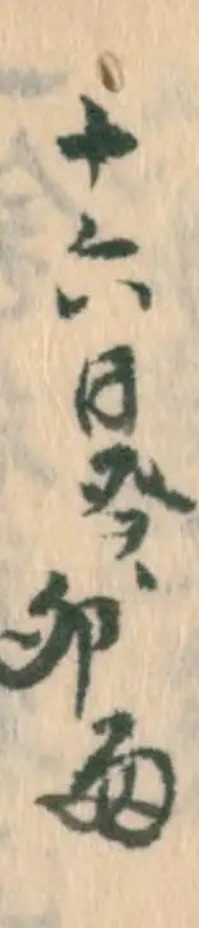十六日癸卯雨
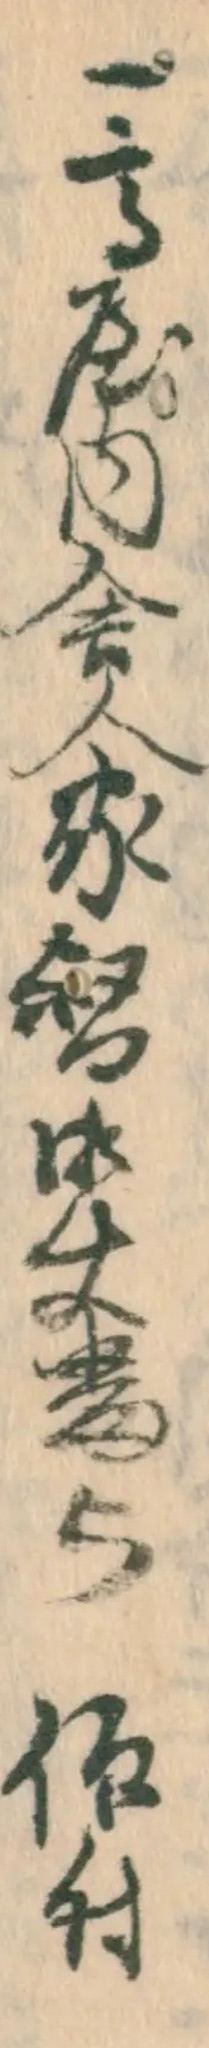一高屋内舎人家督御丈番被仰付
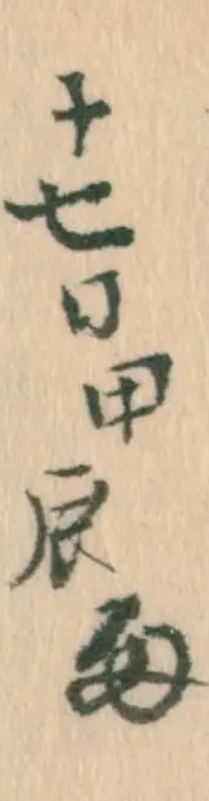十七日甲辰雨
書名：禁裏御所御用日記. [131]
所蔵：国立国会図書館 National Diet Library, JAPAN
